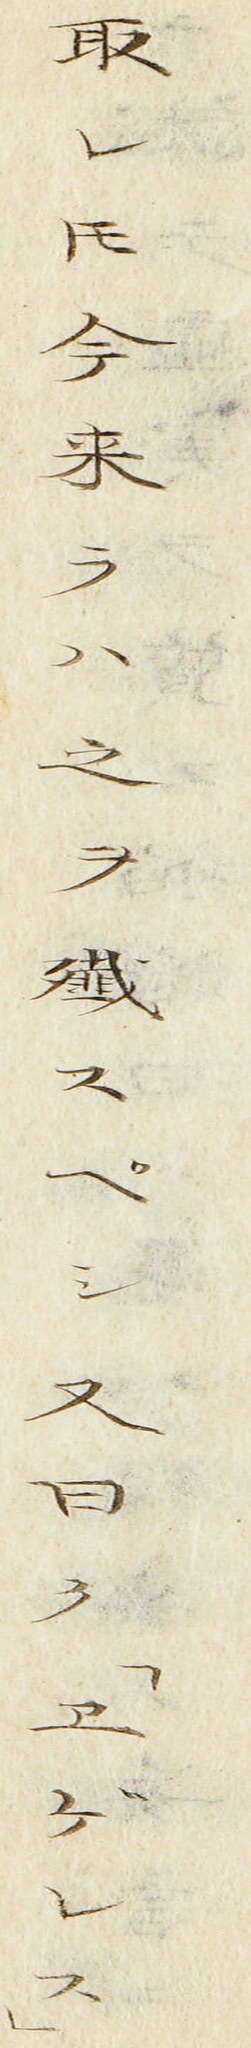取レトモ今来ラハ之ヲ殲スベシ又曰ク「ヱゲレス」
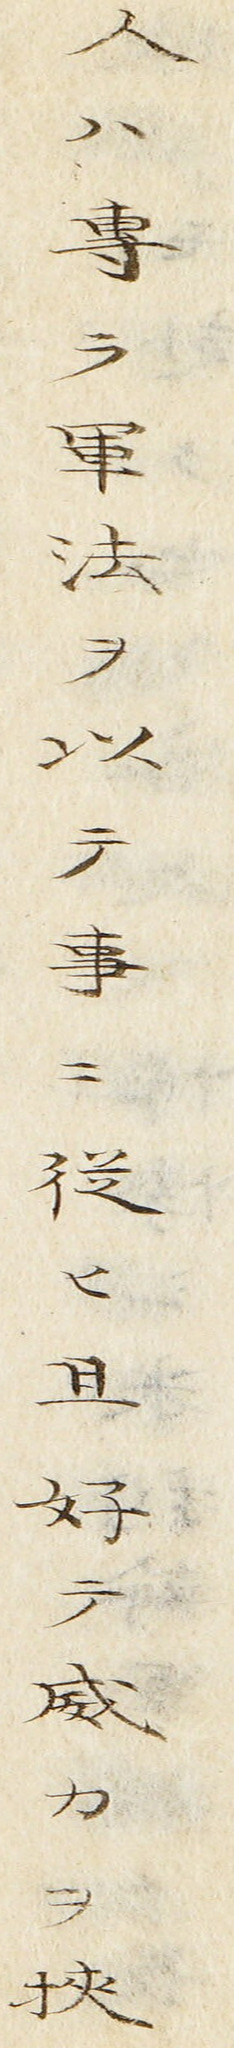人ハ専ラ軍法ヲ以テ事ニ従ヒ好テ威力ヲ挟
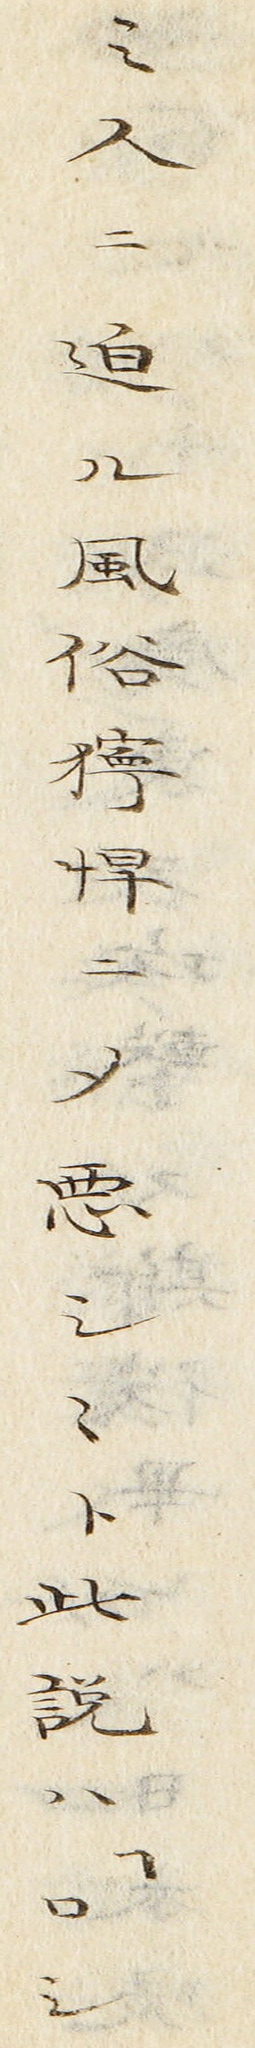ミ人ニ迫ル風俗獰悍ニシテ悪シゝ？ト此説ハ「ロシ
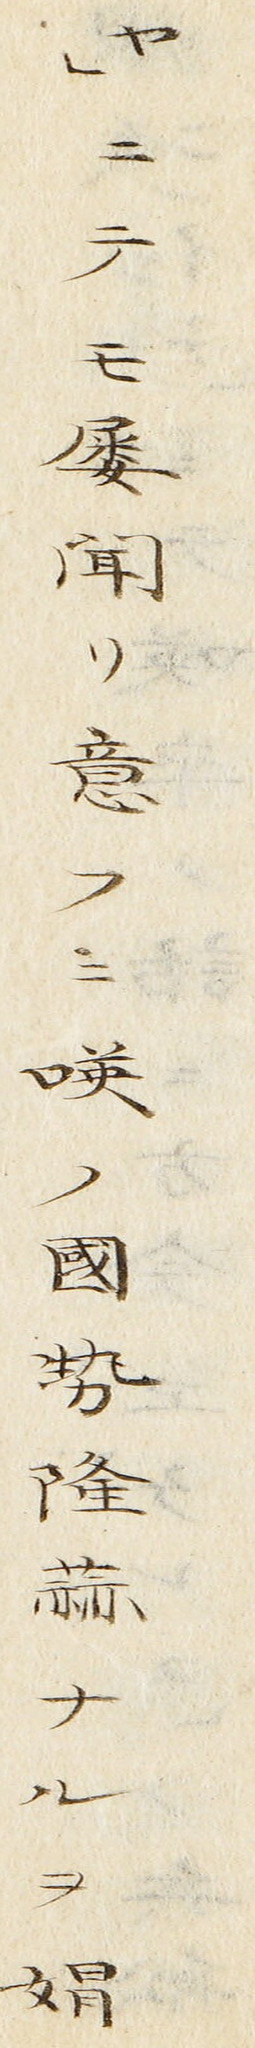ヤ」ニテモ屡聞リ意フニノ國勢隆蒜ナルヲ媢
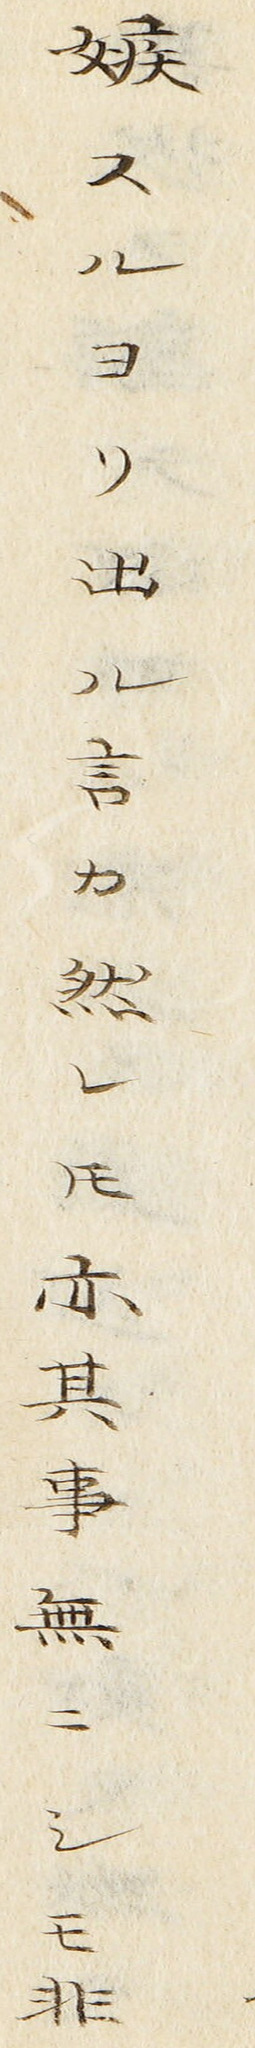嫉スルヨリ出ル言カ然レトモ亦其事無ニシモ非
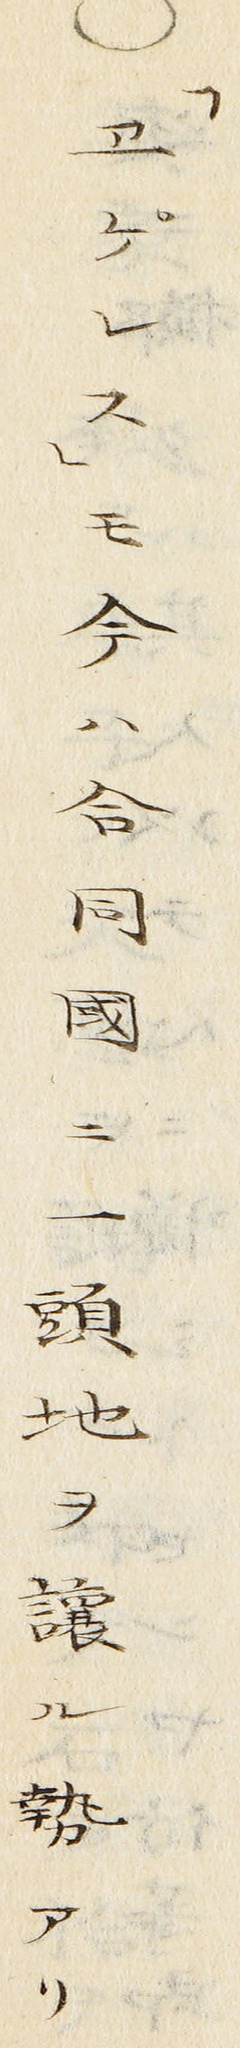〇「ヱゲレス」モ今ハ合同國ニ一頭地ヲ譲ル勢アリ
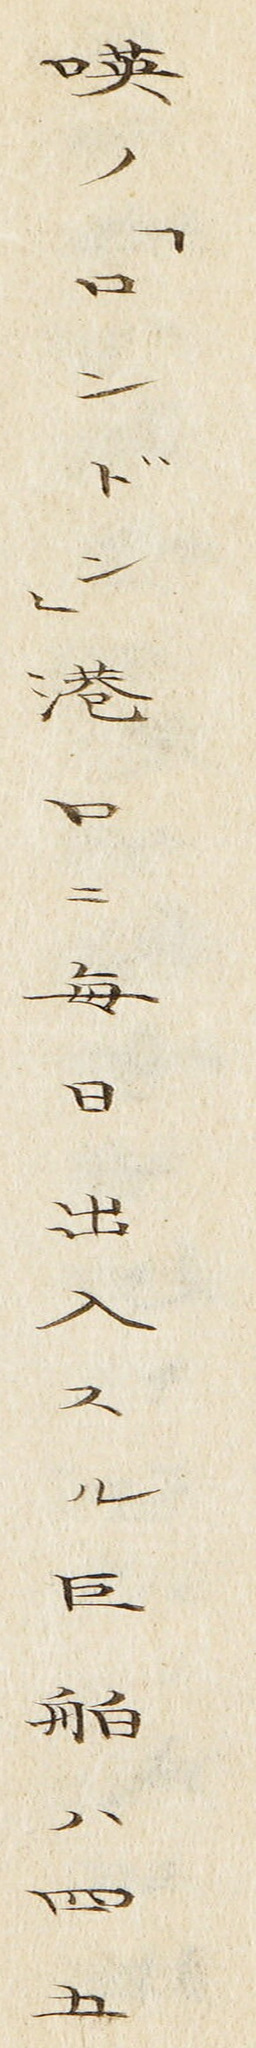〇ノ「ロンドン」港口ニ毎日出入スル巨舶ハ四五
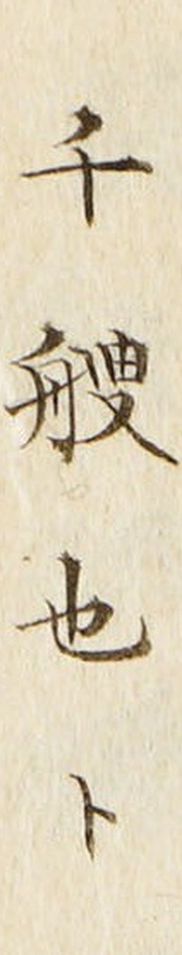千艘也ト
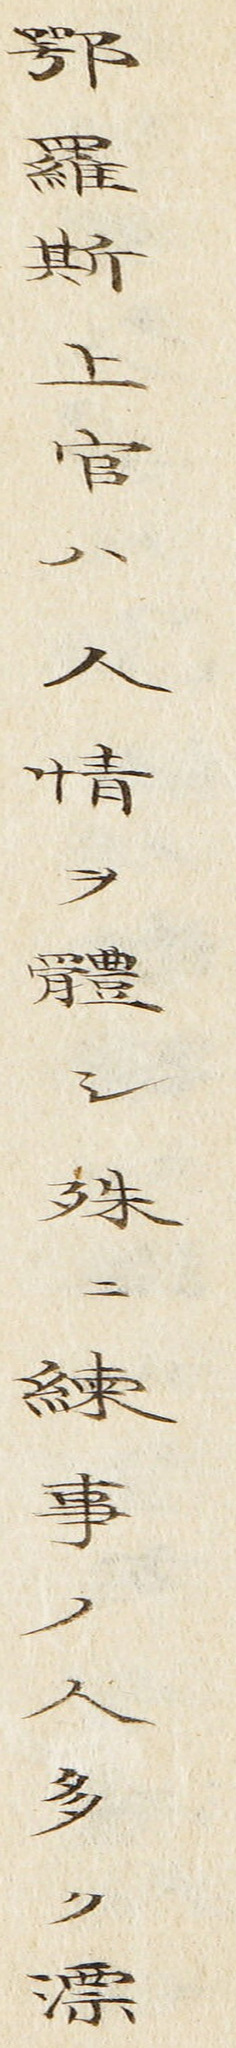〇鄂羅斯上官ハ人情ヲ體シ殊ニ練事ノ人多ク漂
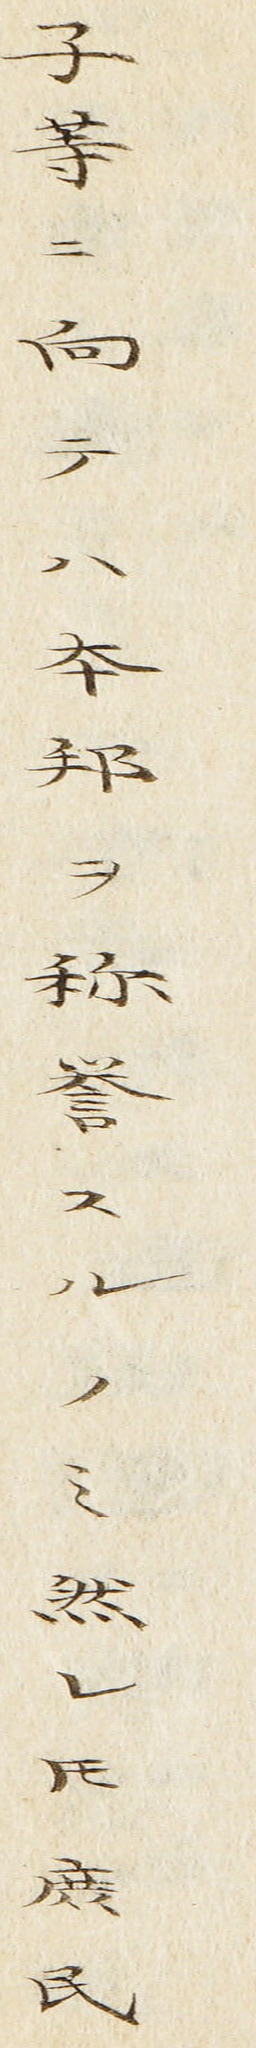子等ニ向テハ本邦ヲ称誉スルノミ然レトモ庶民
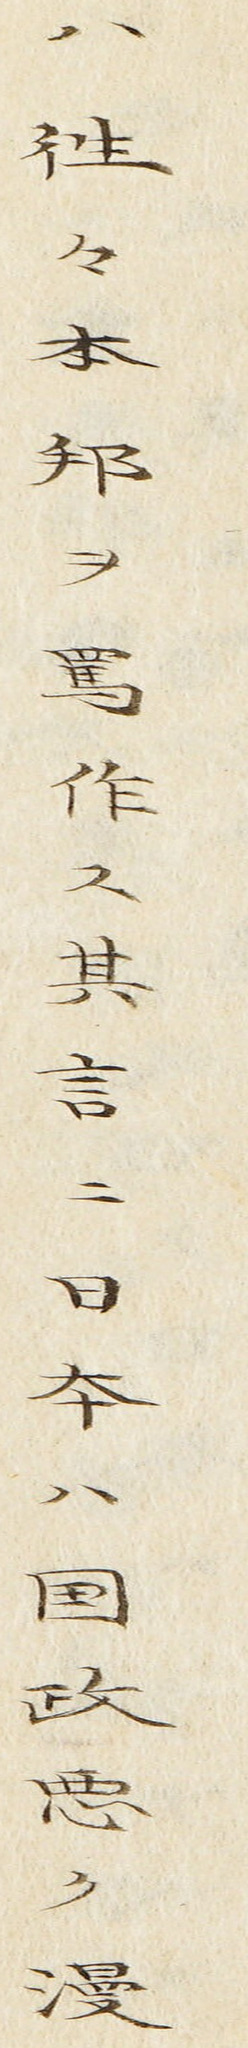ハ往々本邦ヲ罵作ス其言ニ日本ハ国政悪ク漫
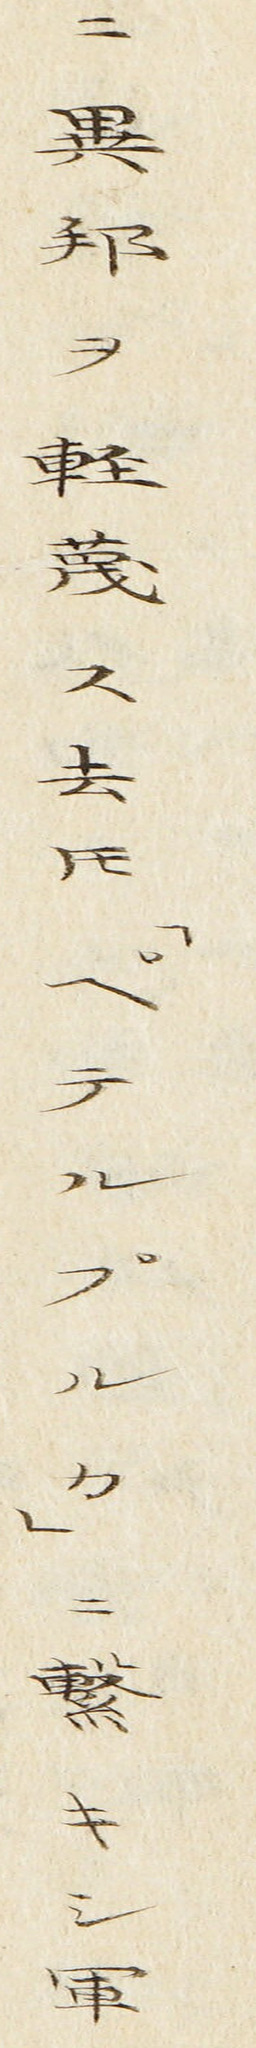ニ異邦ヲ軽蔑ス去トモ「ペテレブルカ」ニ繋キシ軍
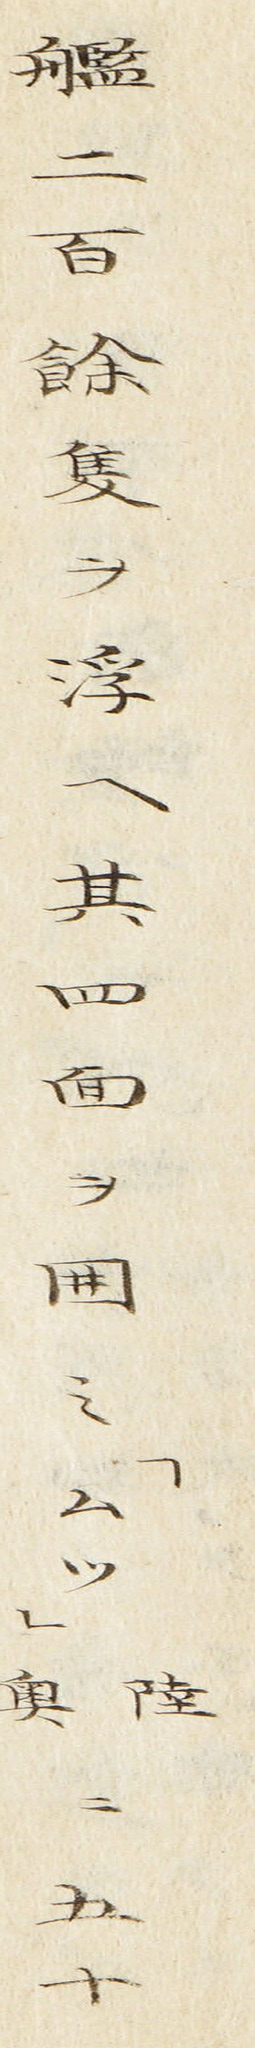艦二百餘隻ヲ浮ヘ其四面ヲ囲ミ「ムツ」陸奥ニ五十
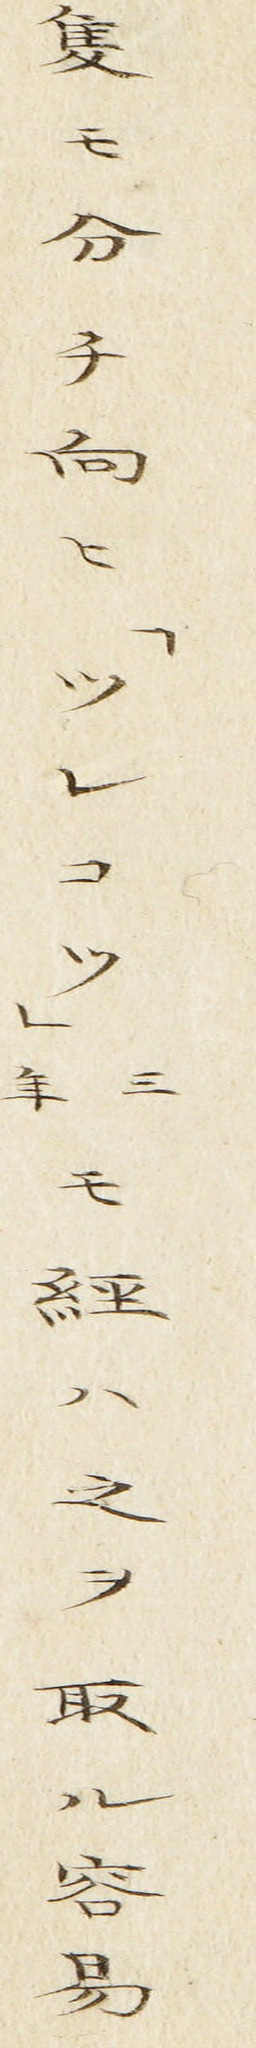隻モ分チ向ヒ「ツレコツ」三年モ経ハ之ヲ取ル容易
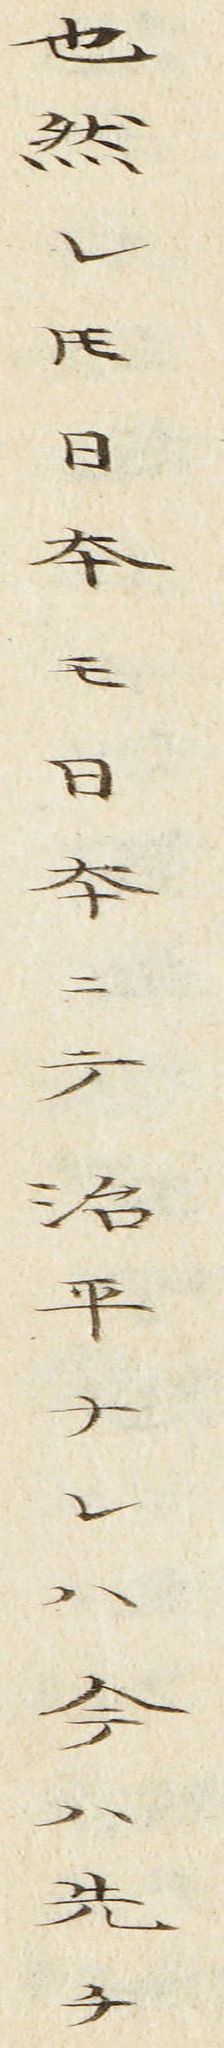也然レトモ日本モ日本ニテ治平ナレハ今ハ先チ
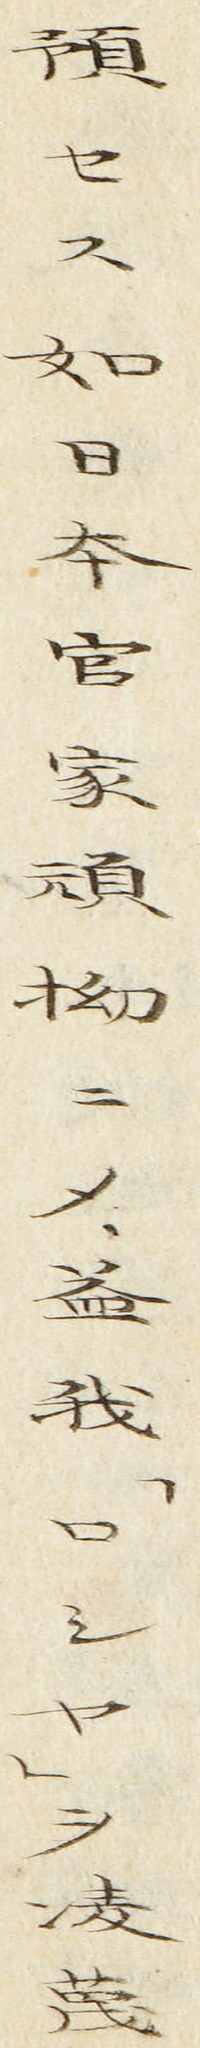預セス如日本官家頑拗ニシテ益我「ロシヤ」ヲ凌蔑
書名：蕃談
